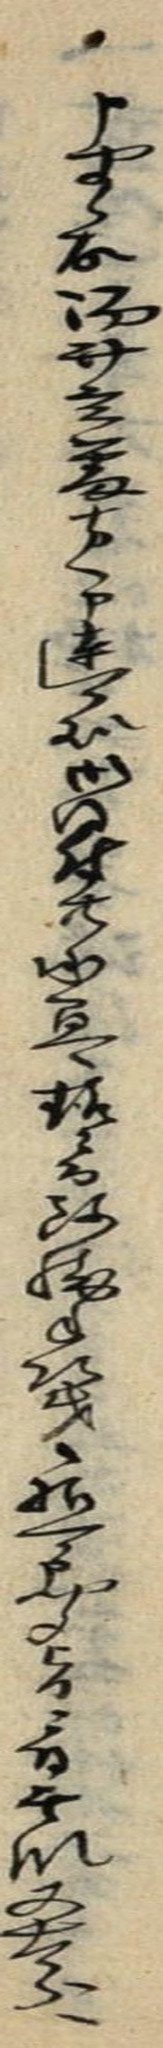申聞候故酒井玄蕃方へ申達候処御目付共承置候趣ニ而致勝手次第候様可申聞旨ニ付其段又太郎へ申達之
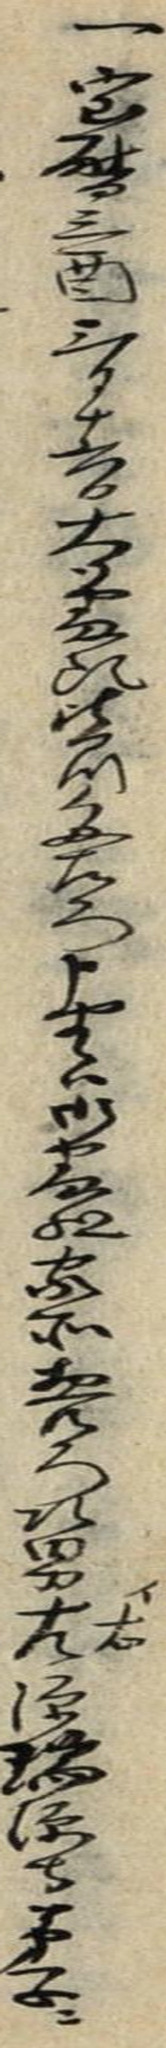一宝暦三酉三月十六日大御番頭皆川多左衛門申聞候ハ御番組家所惣左衛門次男左源瑞源寺弟子ニ
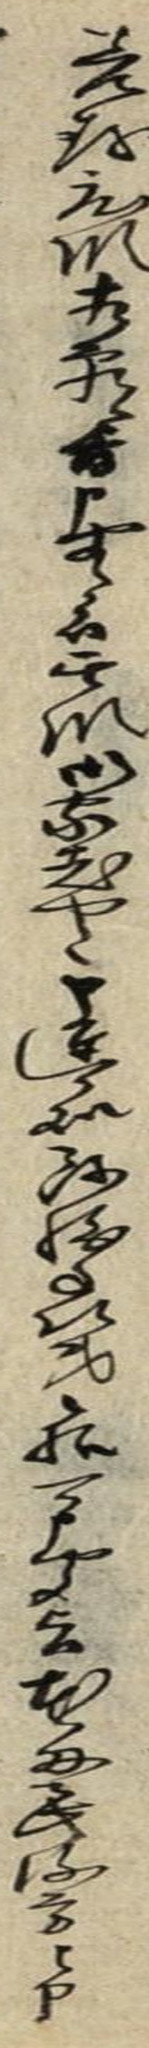差越度段相願候旨申聞候ニ付其段御家老中へ申達候処致勝手次第候様可申聞旨本多民弥方被申
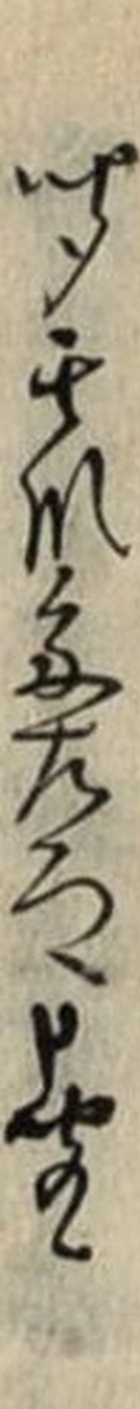聞其段多左衛門へ申聞候
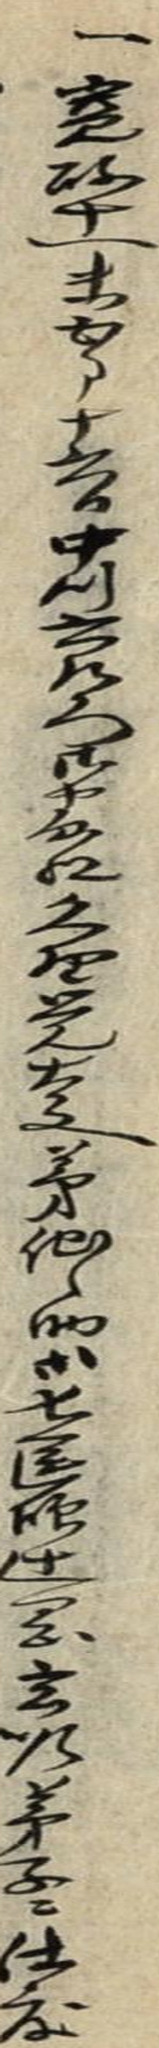一寛政十一未五月十六日中川六左衛門御番組久野覚太夫弟他之助御匕医師辻岡玄順弟子ニ仕度
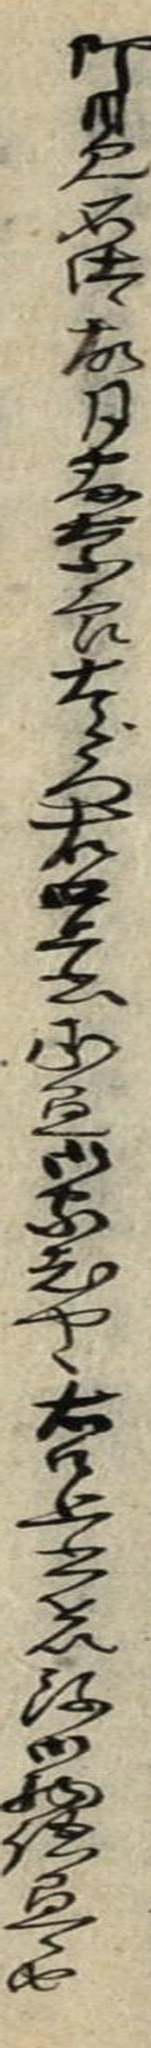御目見不仕候故月番奈良太郎右衛門右口上書承置御家老中へ右口上書を以致御物語置候由
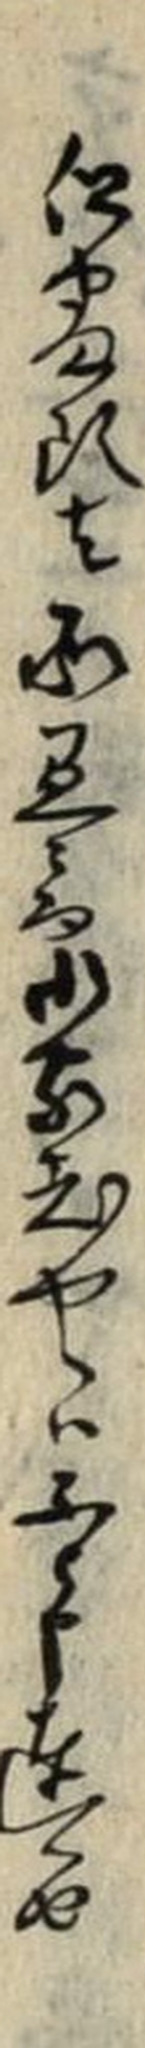但番頭者承置ニ而御家老中へハ不被申達候由
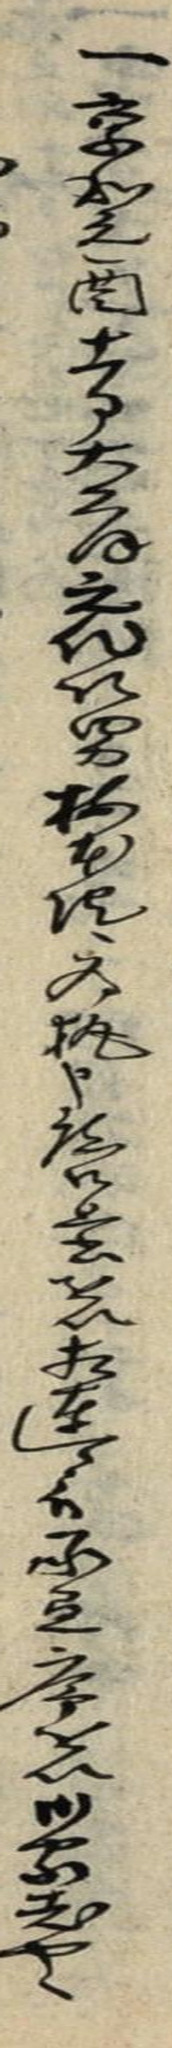一享和元酉十一月大久保元作次男梅本院へ為執申度口上書を以相達候ニ付承置序を以御家老中へ
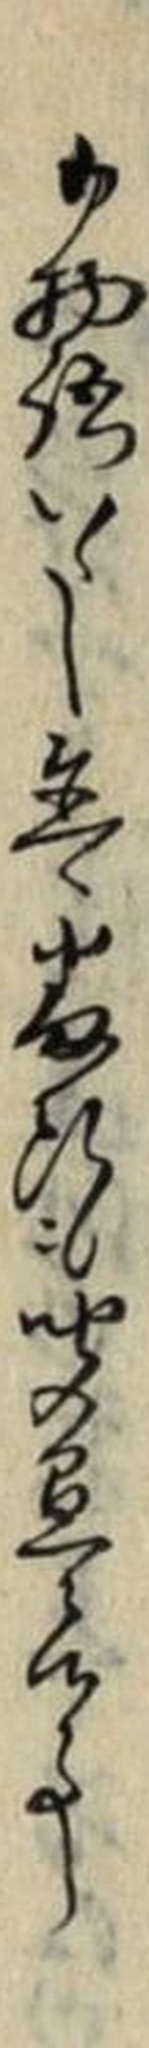御物語いたし置候番頭も聞置候事
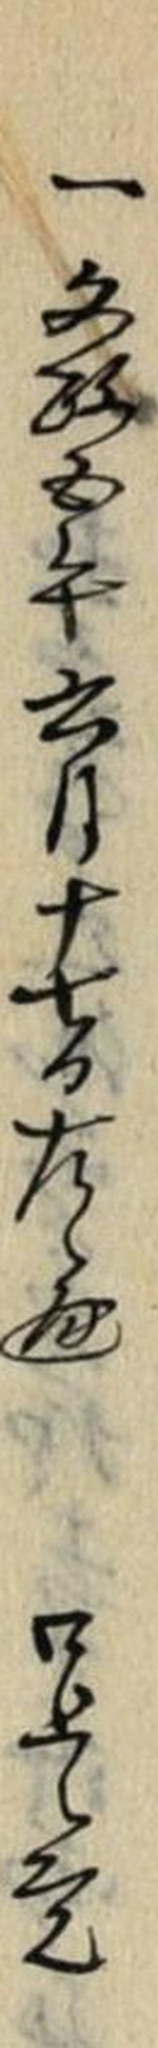一文政五年六月十七日左之通口上之覚
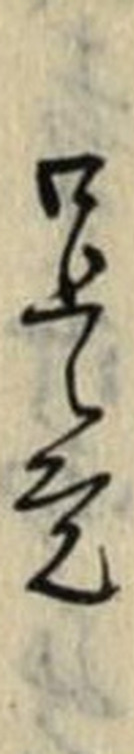口上之覚
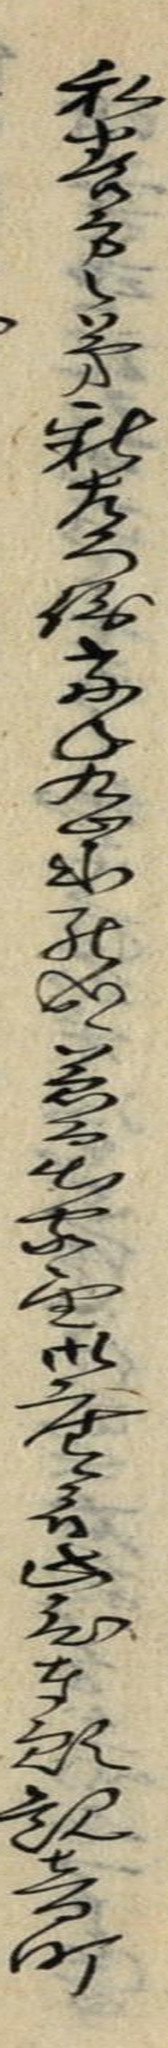私養方之弟新左衛門儀当年九歳罷成候兼而出家之望ニ御座候ニ付此度奉願観音町
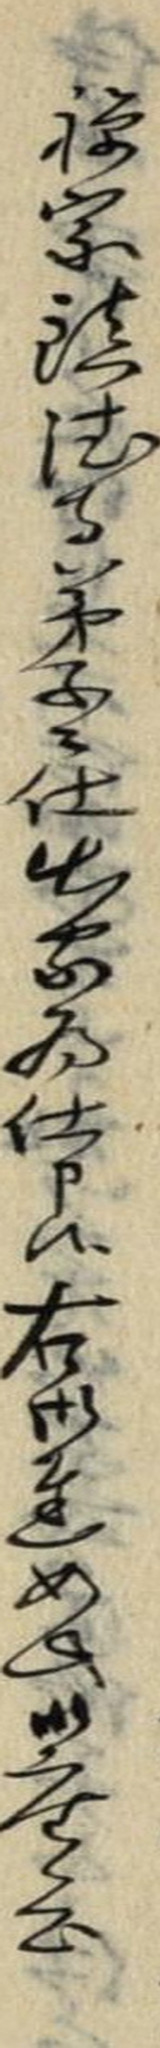禅宗鎮徳寺弟子ニ仕出家為仕申候右御達如此御座候以上
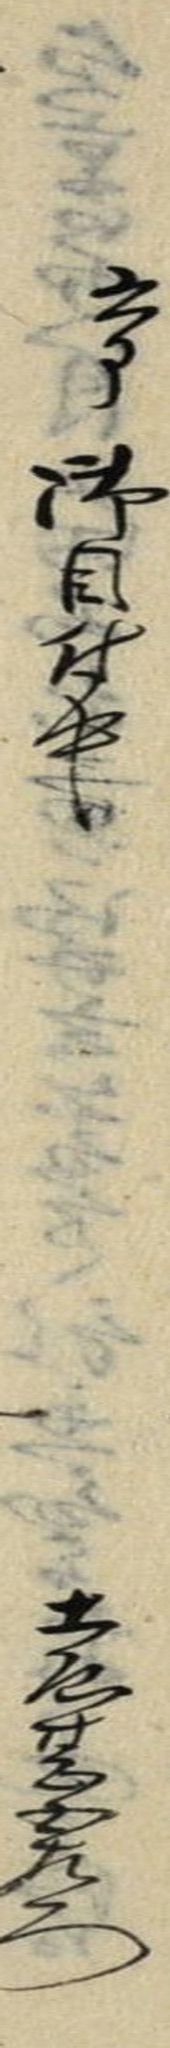六月御目付中土屋甚五左衛門
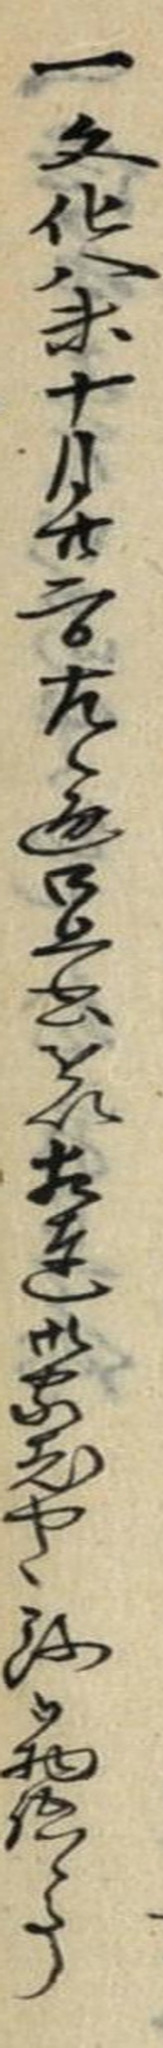一文化八未十月廿ニ日左之通口上書を以相達御家老中へ致御物語候事
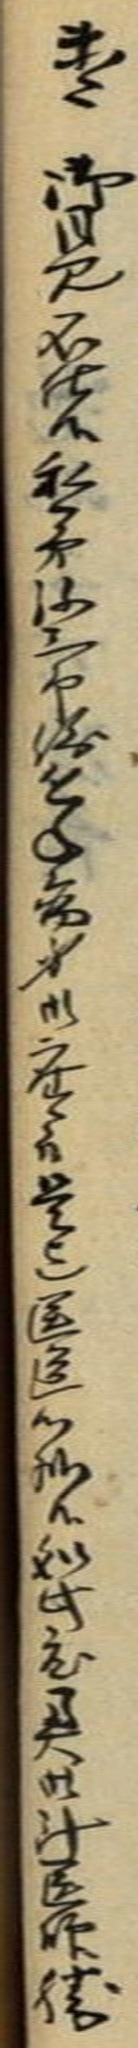未た御目見不仕候私弟弥三郎儀近年病身御座候ニ付是迄医道心掛候処此度奥御針医師勝
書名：養子縁組之部
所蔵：福井県文書館 Fukui Prefectural Archives
